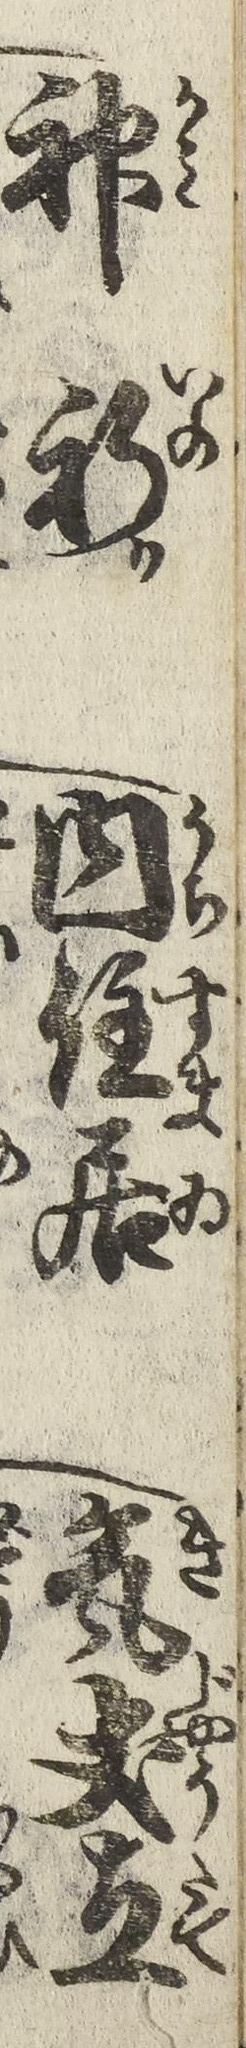神祈り内住居気丈立
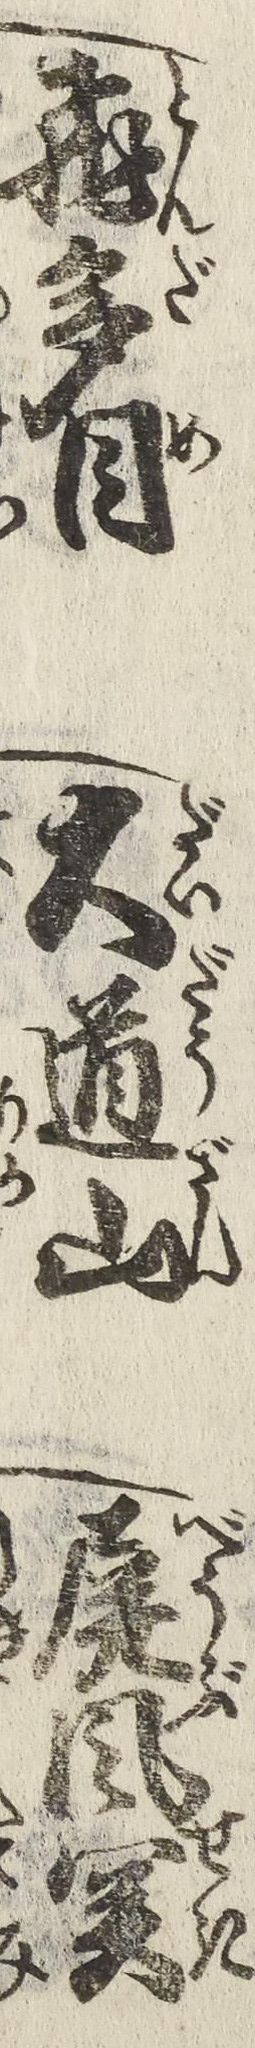飛多目大道山屏風関
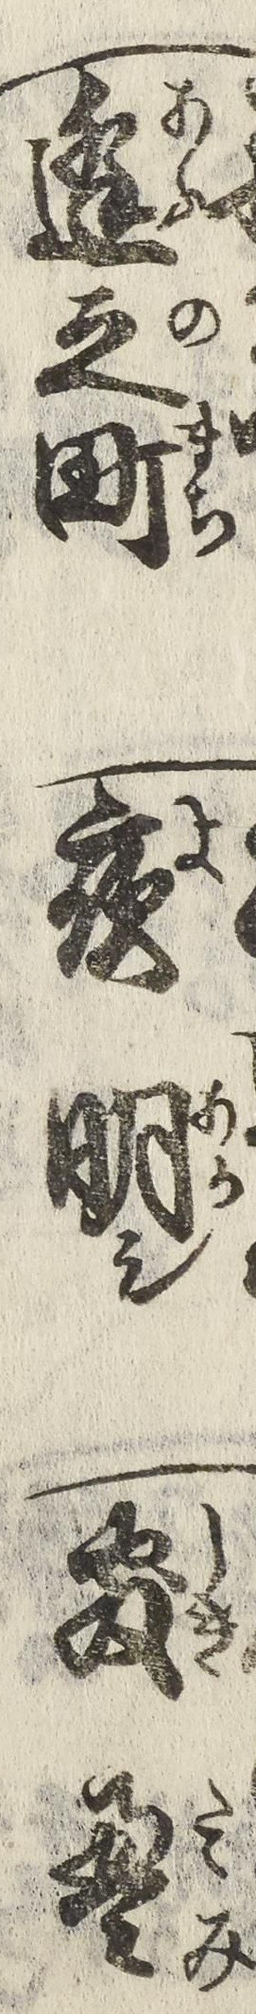逢之町夜明シ敷畳
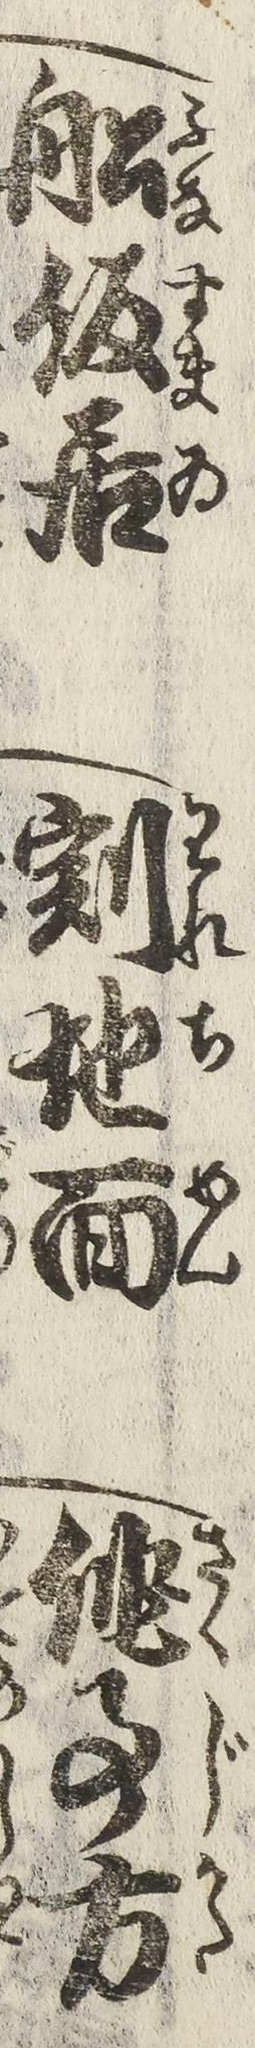船仮居割地面作事方
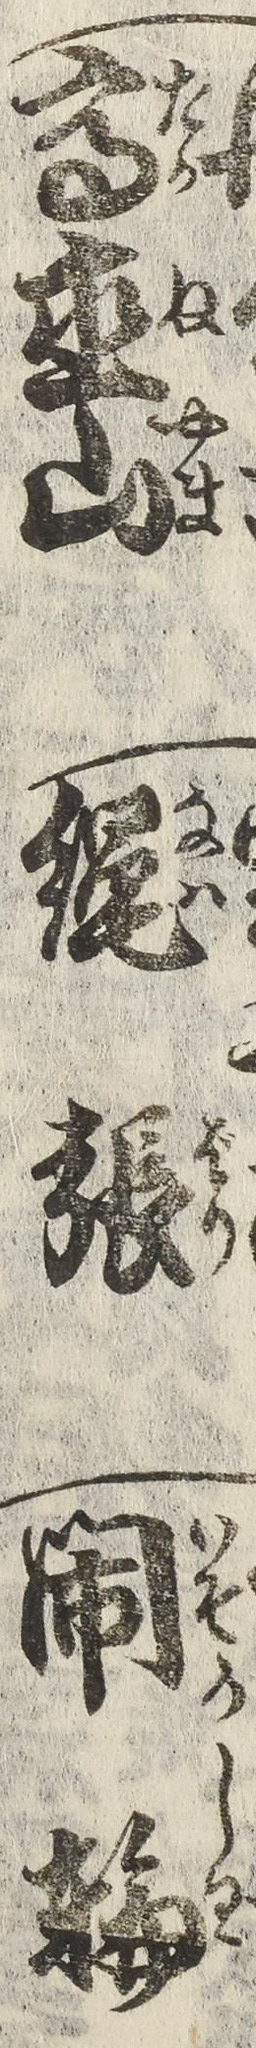高直山縄張閙輪
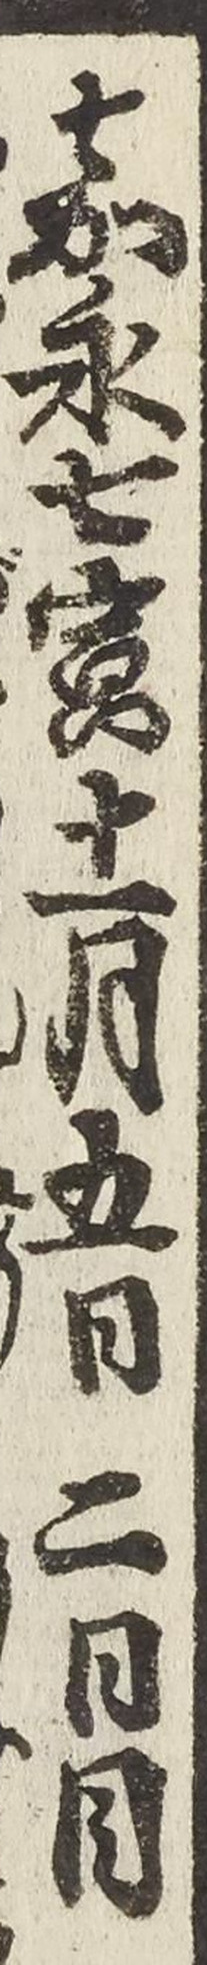嘉永七寅十一月五日二日目
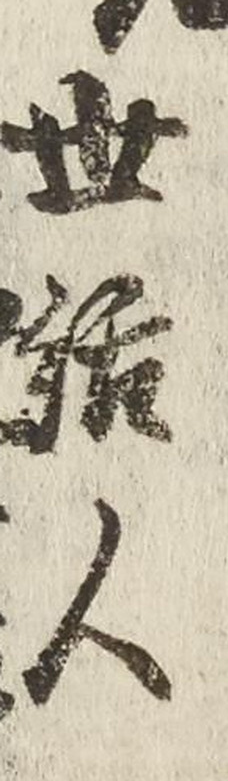世話人
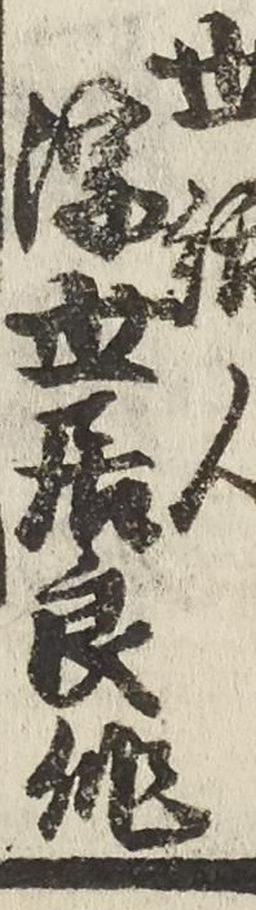浮世居良作
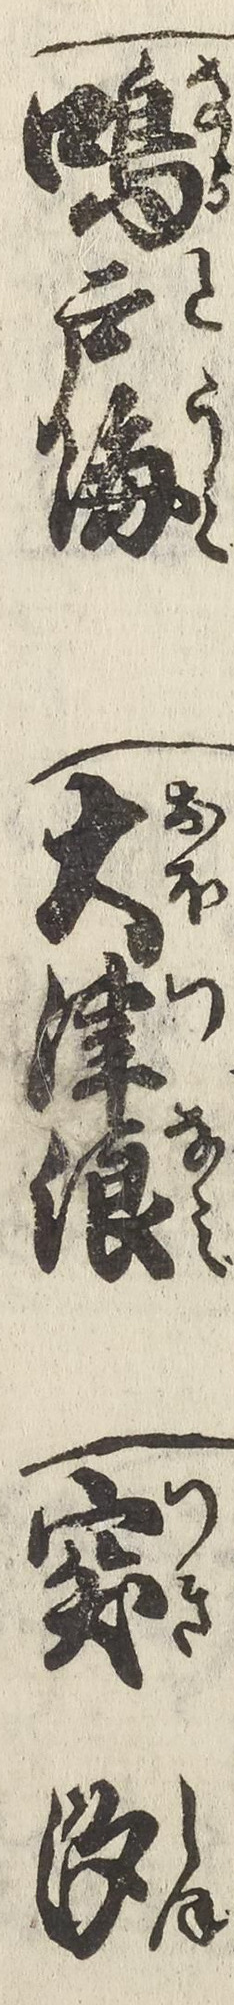鳴戸海大津浪突汐
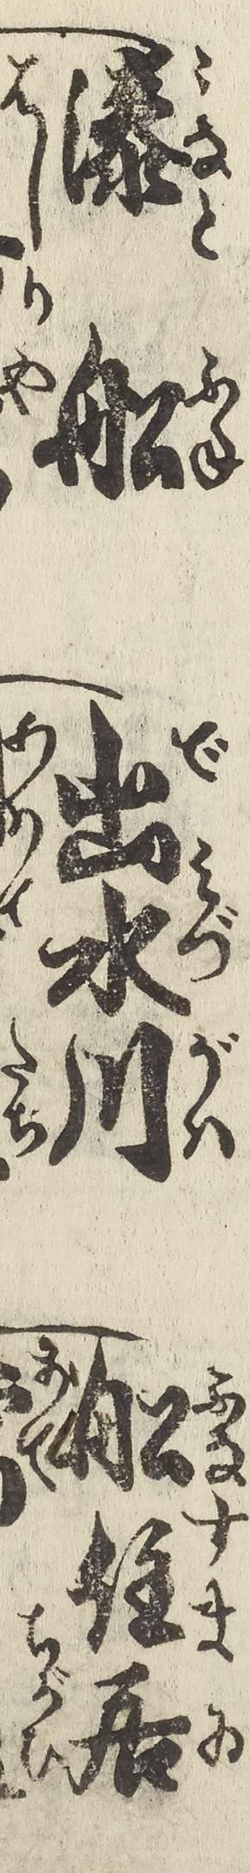湊船出水川船住居

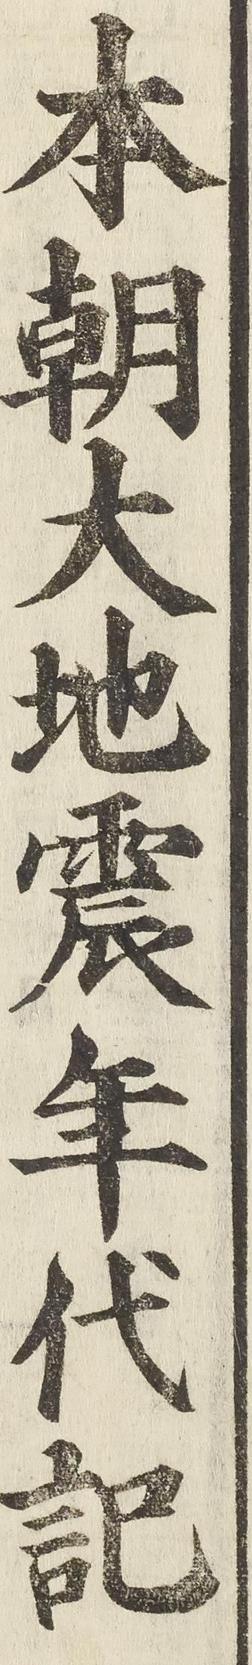本朝大地震年代記
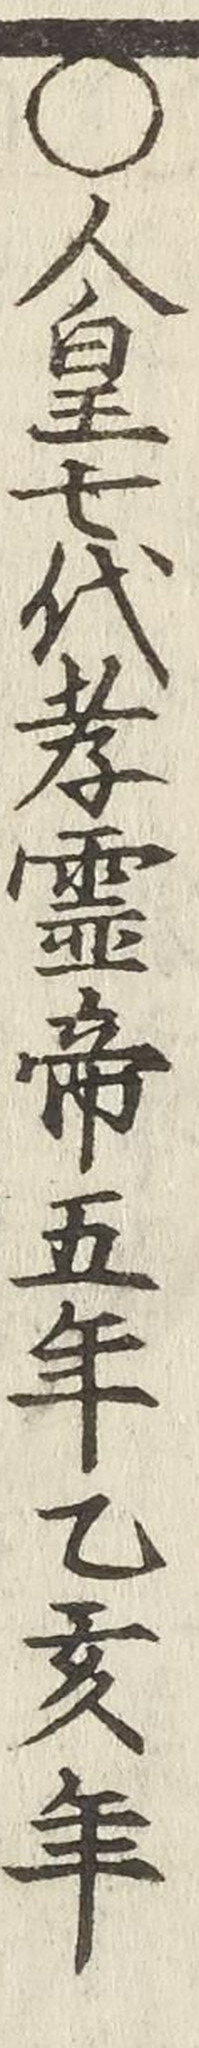○人皇七代孝霊帝五年乙亥年
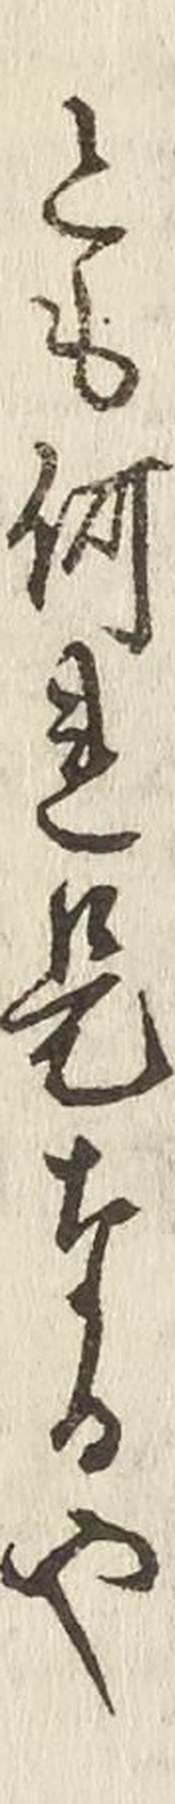とも何れ是なるや
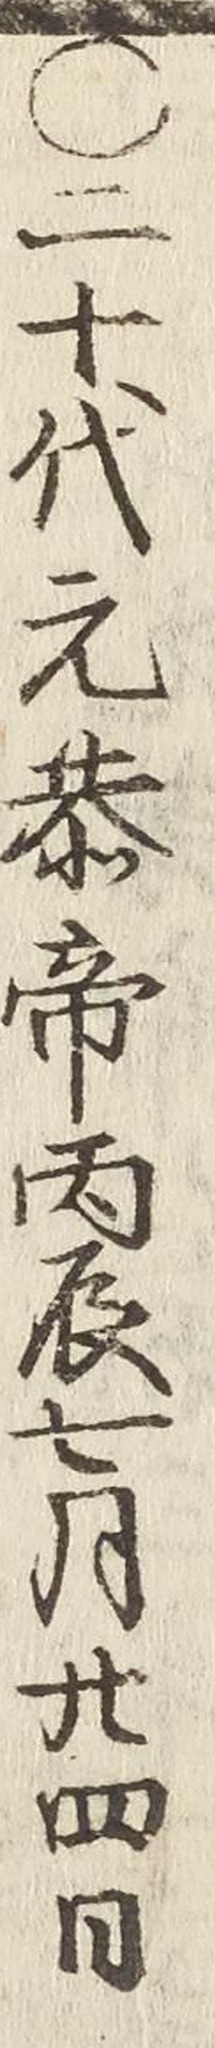○二十代元恭帝丙辰七月廿四日叡
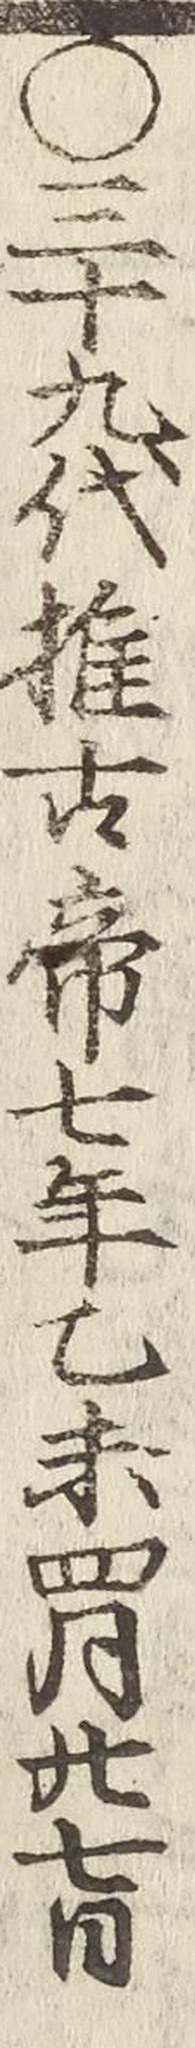○三十九代推古帝七年乙未四月廿七日山
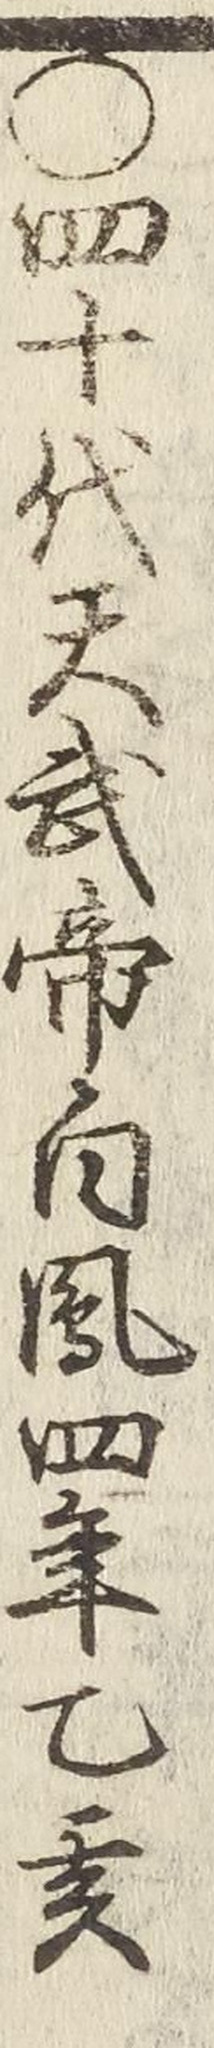○四十代天武帝白鳳四年乙亥近江
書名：大地震世直仕艸紙
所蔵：東京大学地震研究所図書室 Earthquake Research Institute Library, The University of Tokyo, JAPAN
